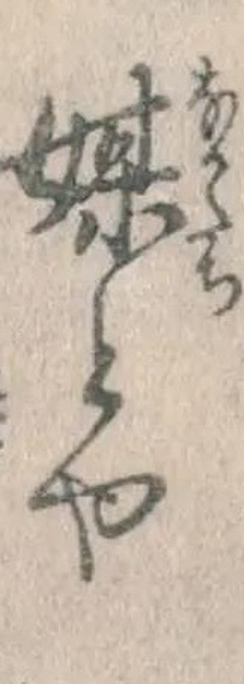媒とや
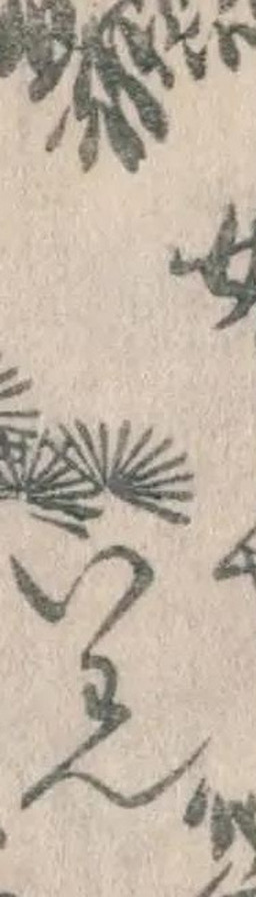いわん
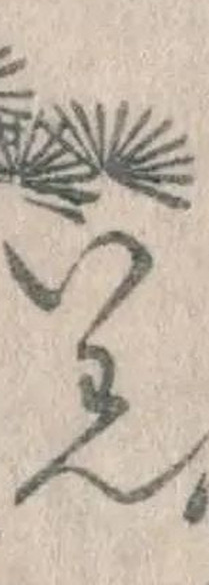いわん
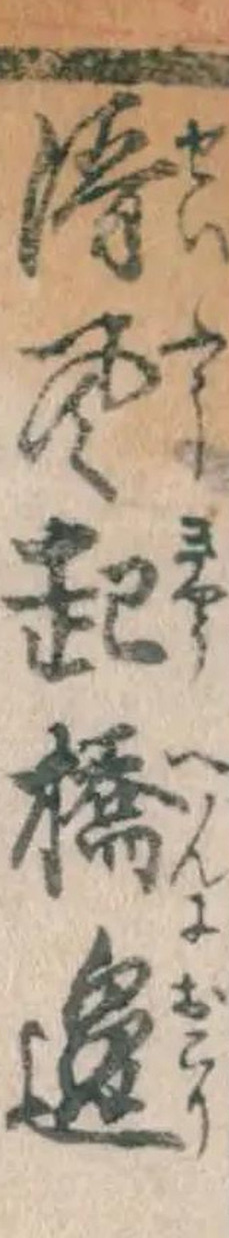清風起橋辺
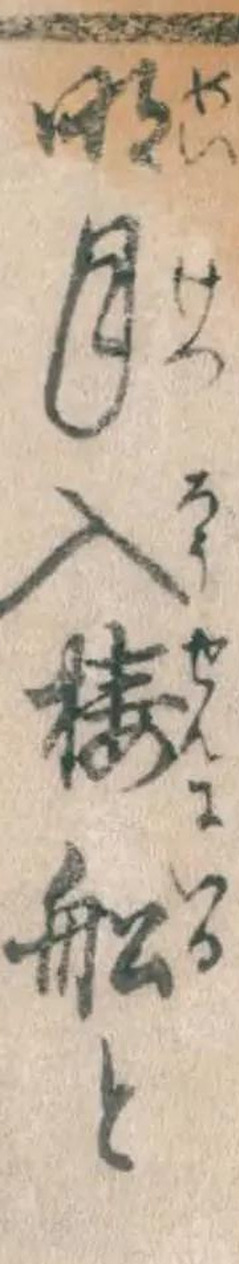名月入楼船と
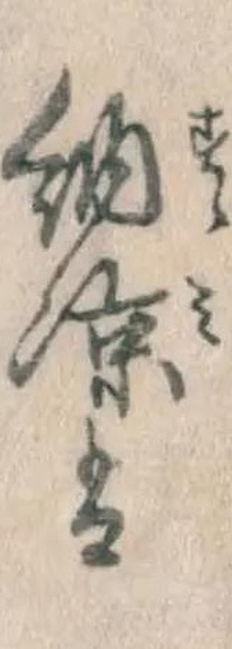納涼は
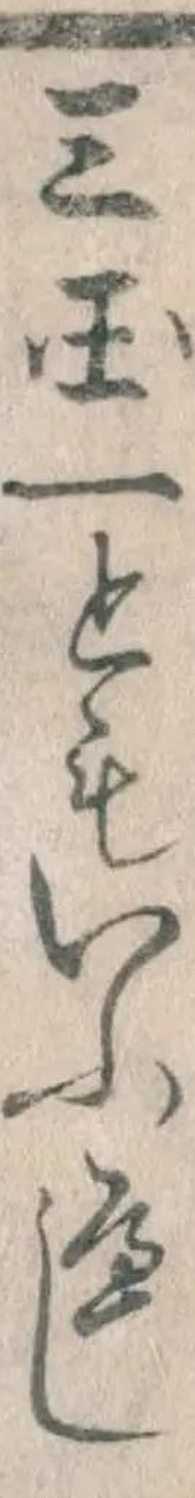三国一ともいふへし
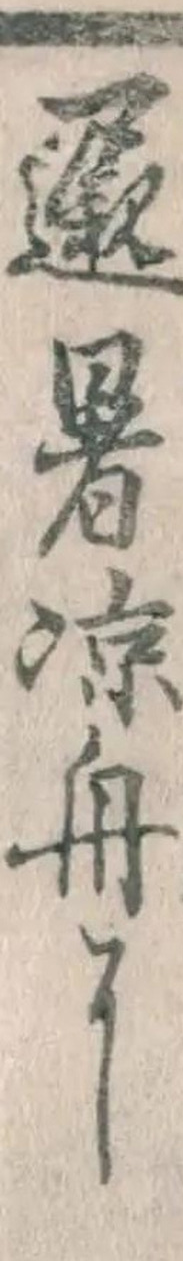避暑涼舟に
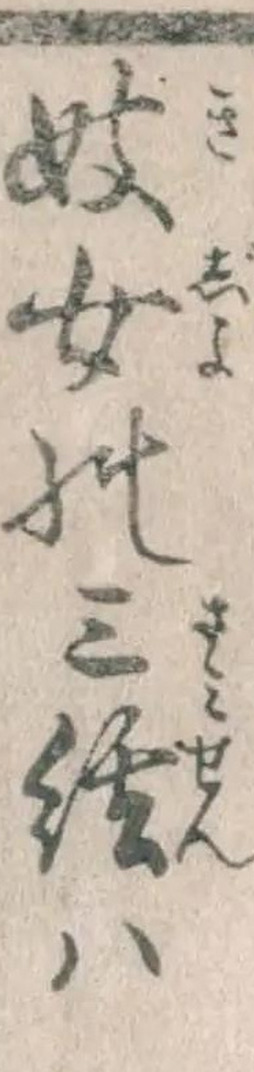妓女の三絃は
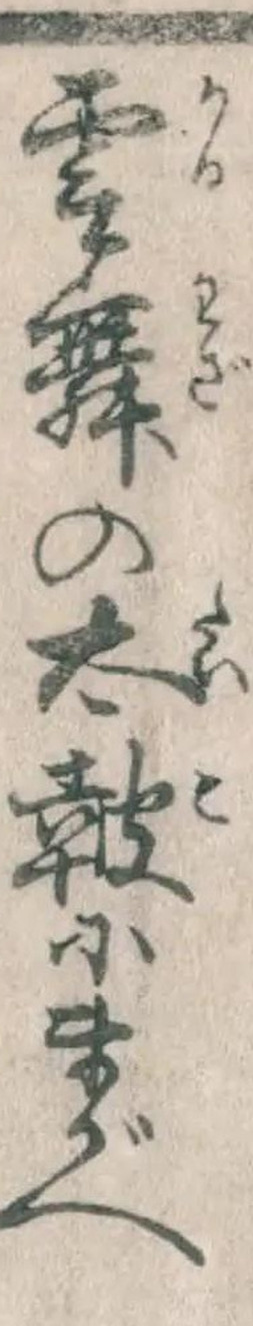雲舞の太皷にまがへ
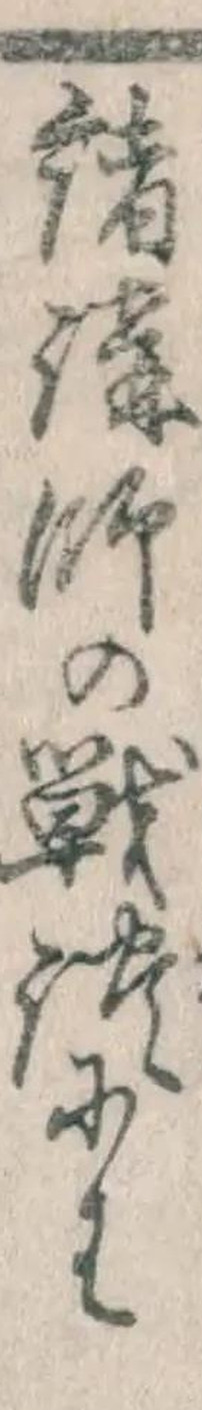諸講師の戦談にも
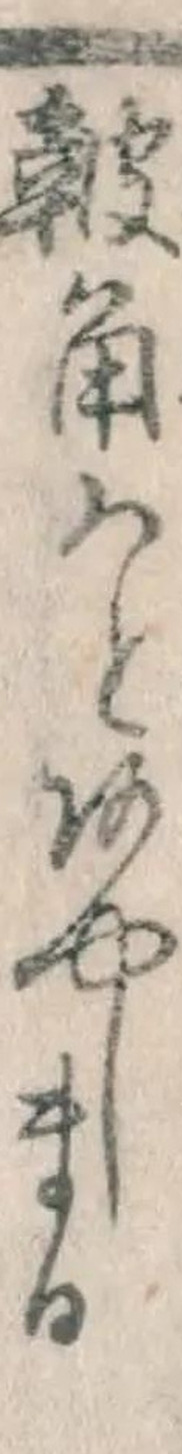皷角かとあやしまる
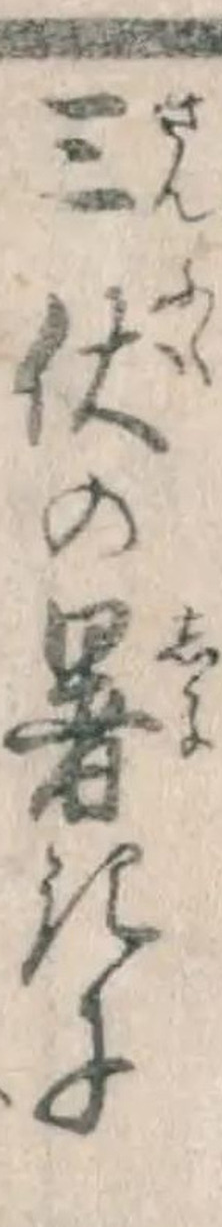三伏の暑きに
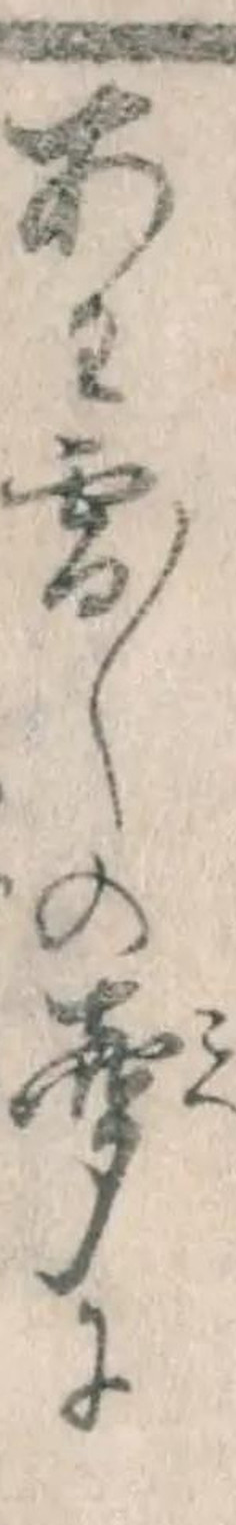あわ雪の〳〵聲に
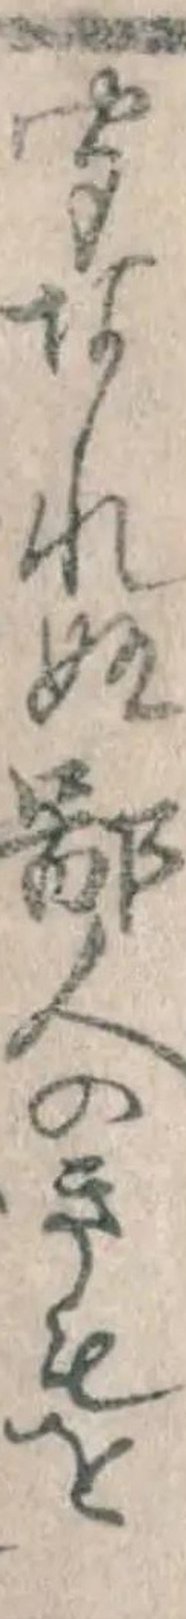聞なれぬ鄙人のきもを
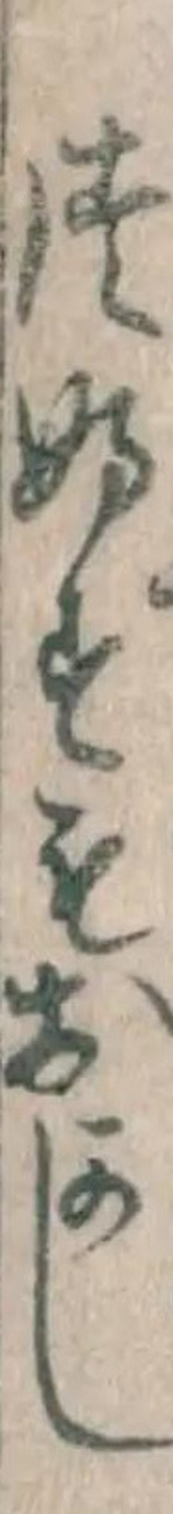つふすもおかし
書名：絵本物見岡
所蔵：国立国会図書館 National Diet Library, JAPAN
